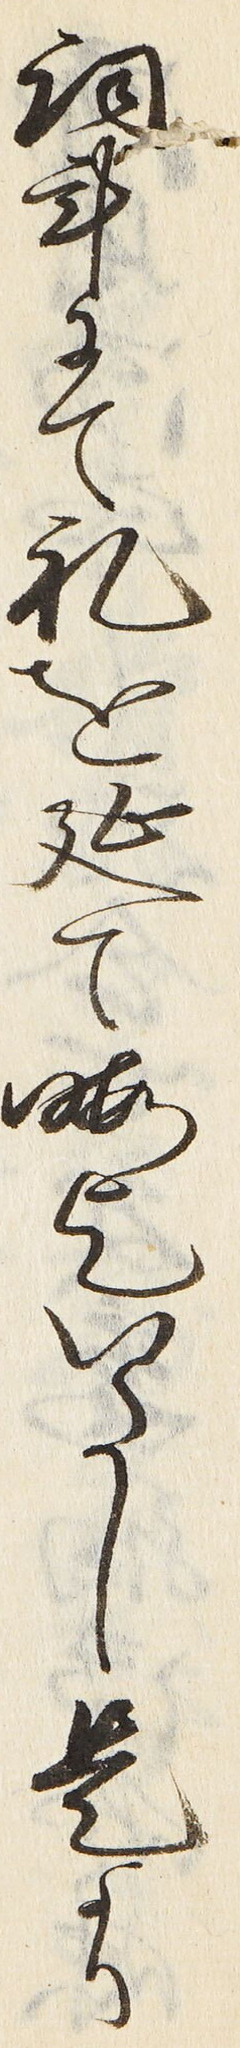詞計にて礼を延て暇乞いたし是より
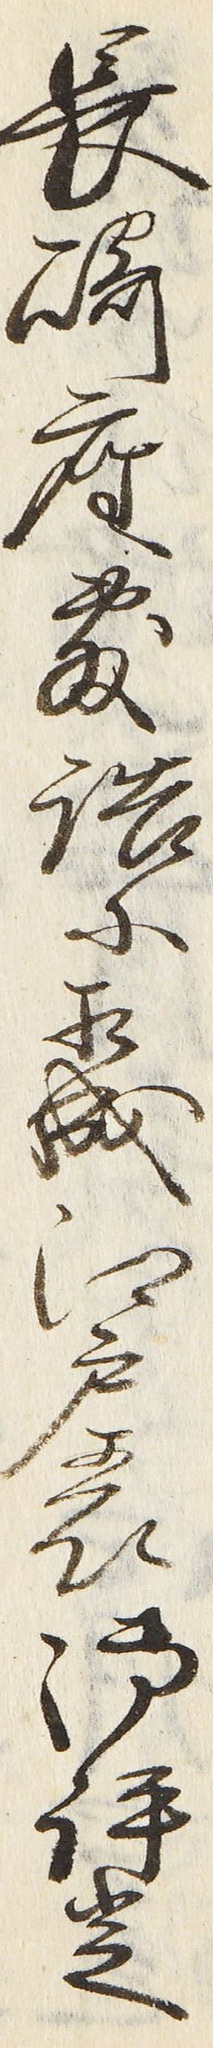長崎座敷詰に相成江戸表御評定
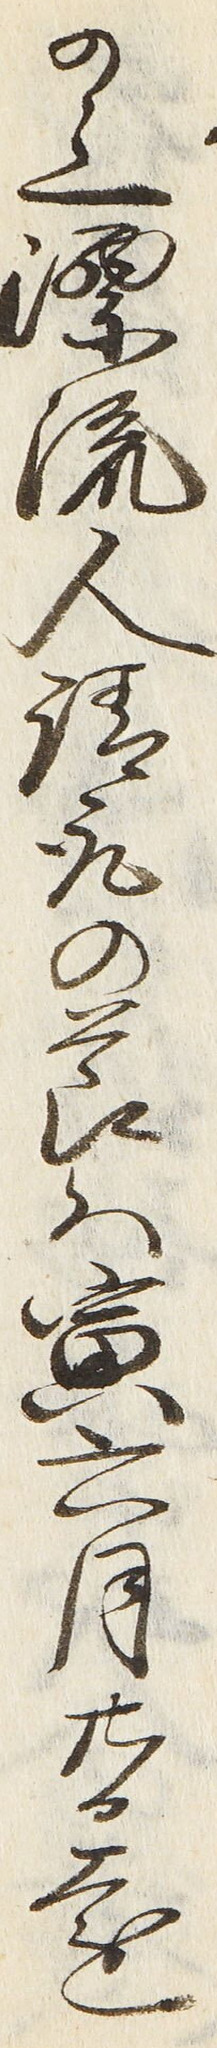の上漂流人請取の節ハ寅六月廿日遠
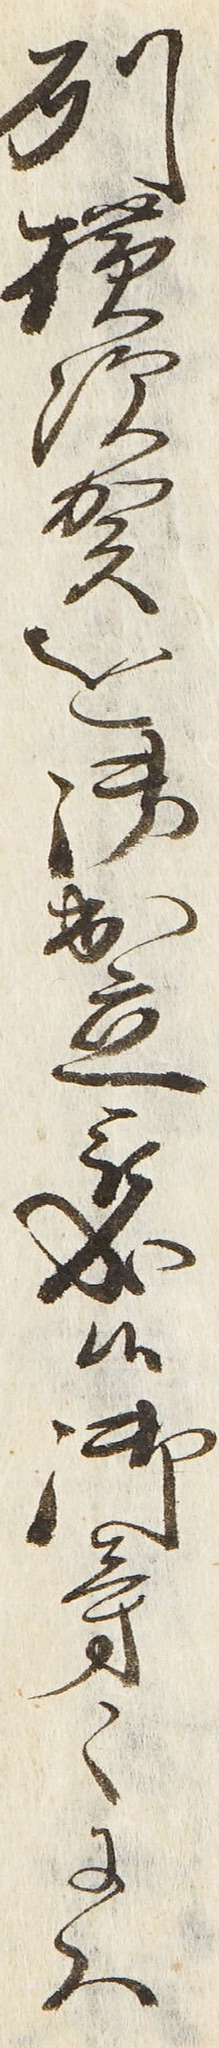州横須賀を御出立被成候御寺々にハ
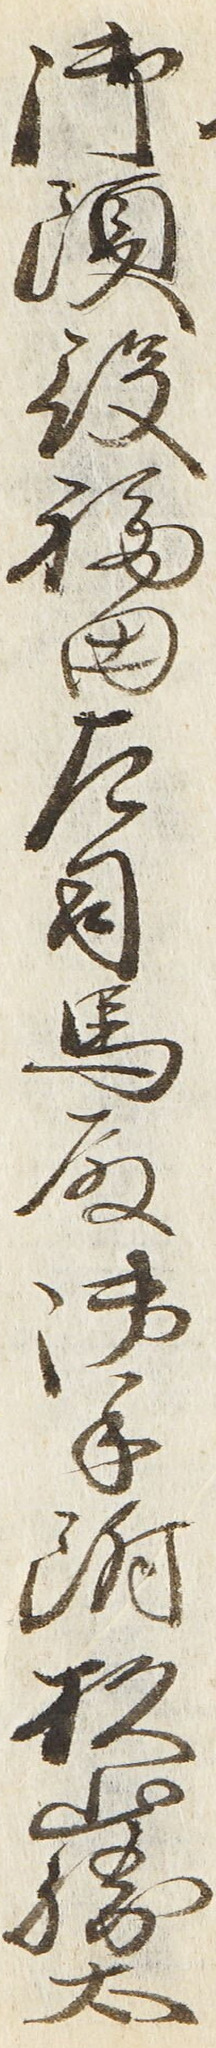御預役福田左司馬殿御手附杦山勝太
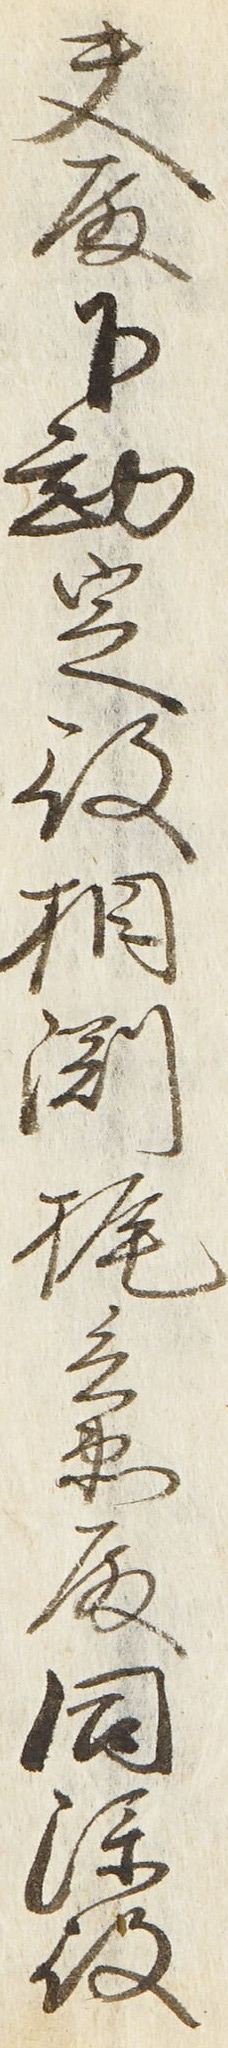夫殿下勧定役相渕梶兵衛殿同添役
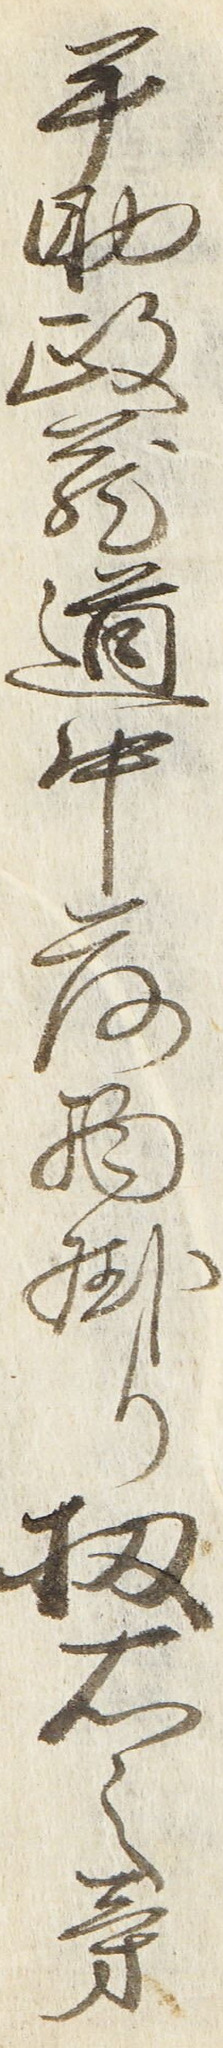平助政蔵道中荷物掛り扨右之寺
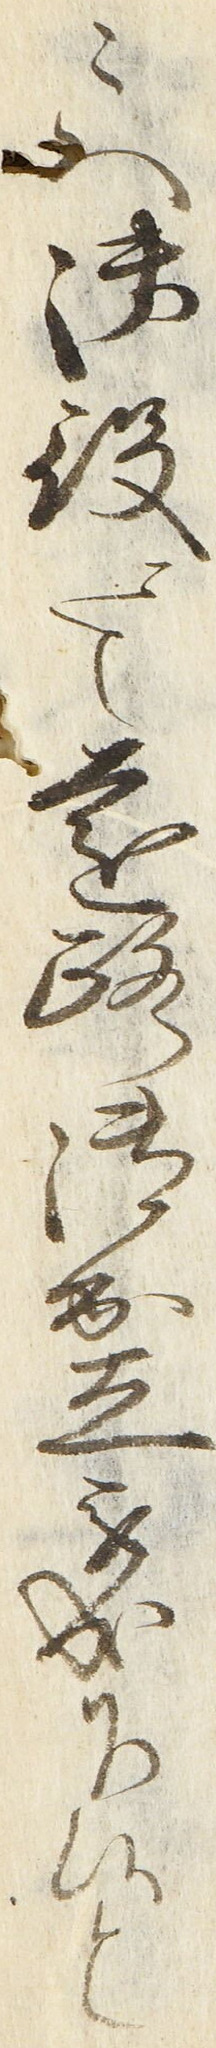々ハ御役ニて遠路御出立被成下候と

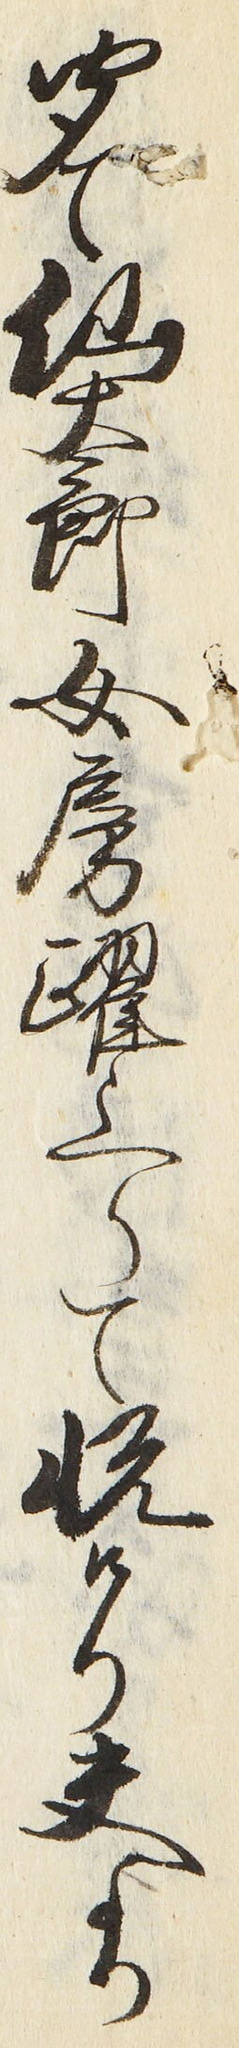聞て仙太郎女房躍上りて悦けり夫より
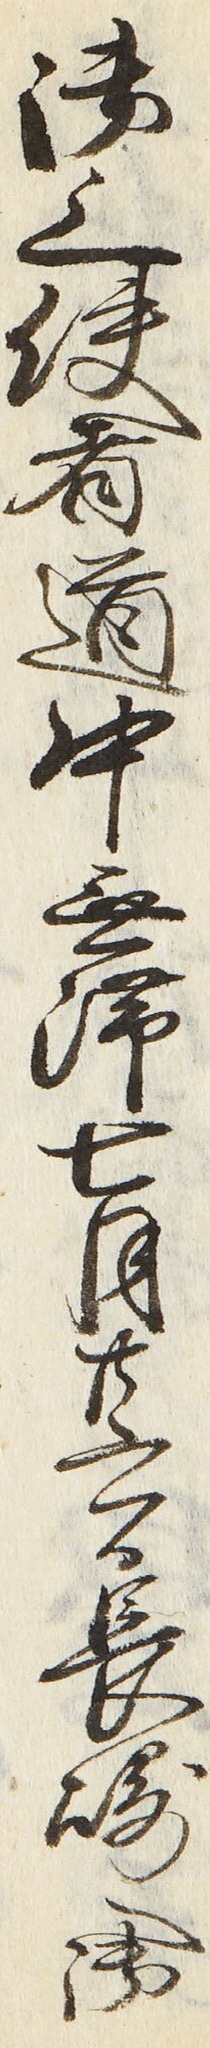御上使者道中無滞七月廿六日長崎へ御
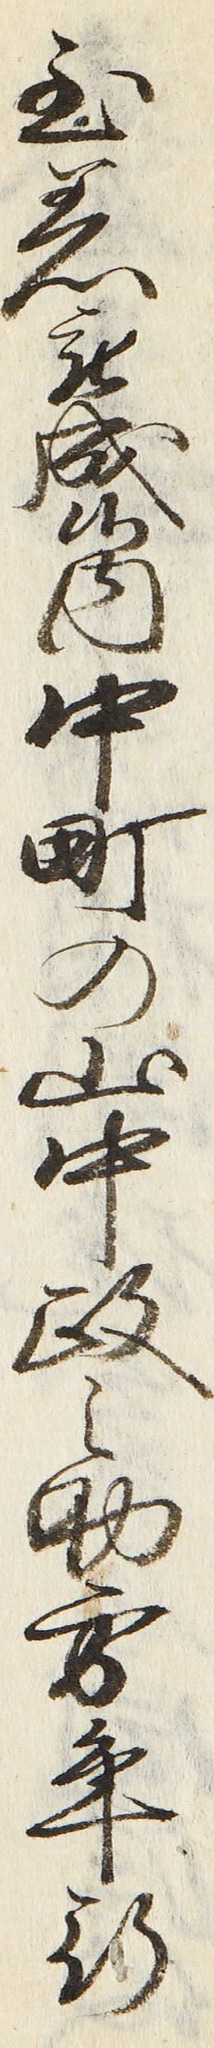至着被成候内中町の山中政之助方年行
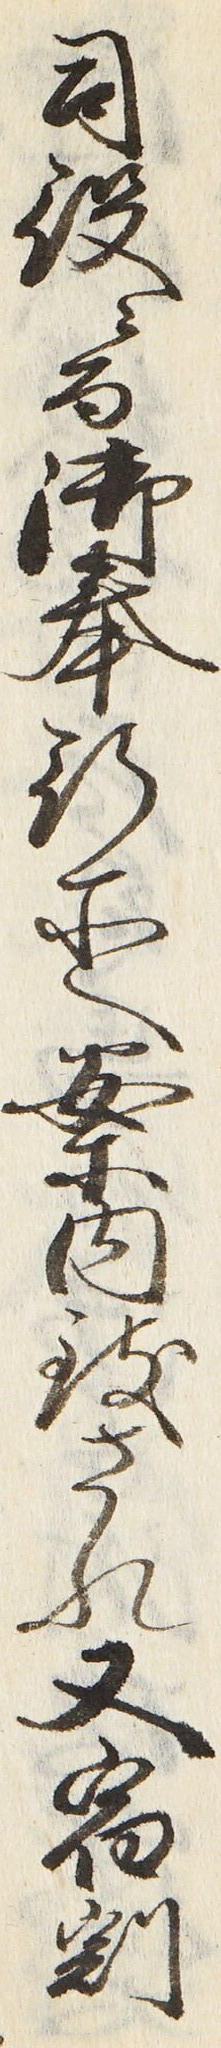司役ニ而御奉行所へ案内致され又宿割
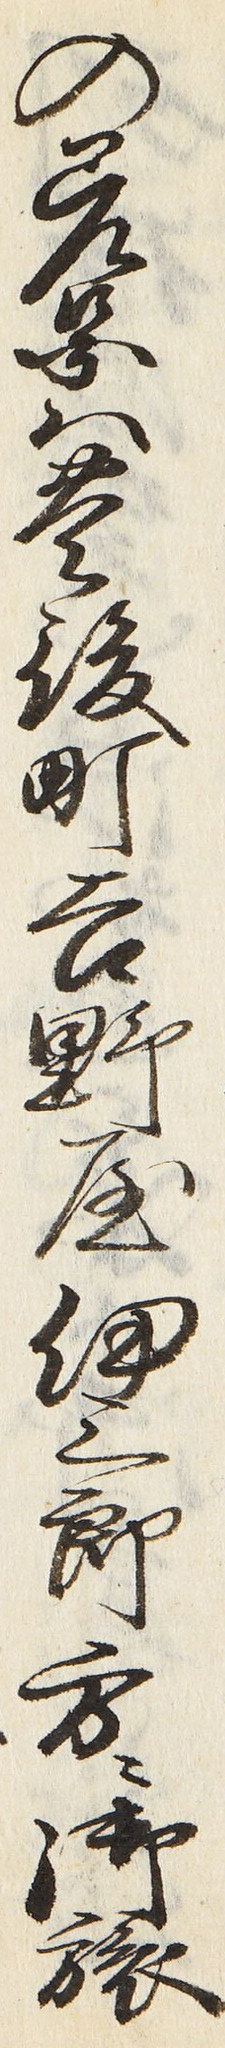の差図ハ尽後町吉野屋伊三郎方ニ御旅
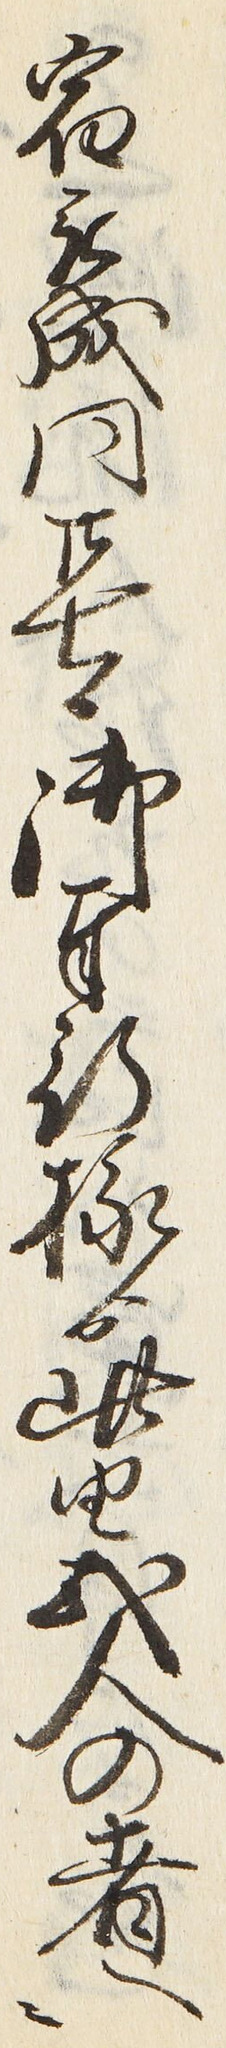宿被成同廿七日御奉行様ゟ此由弐人の者へ
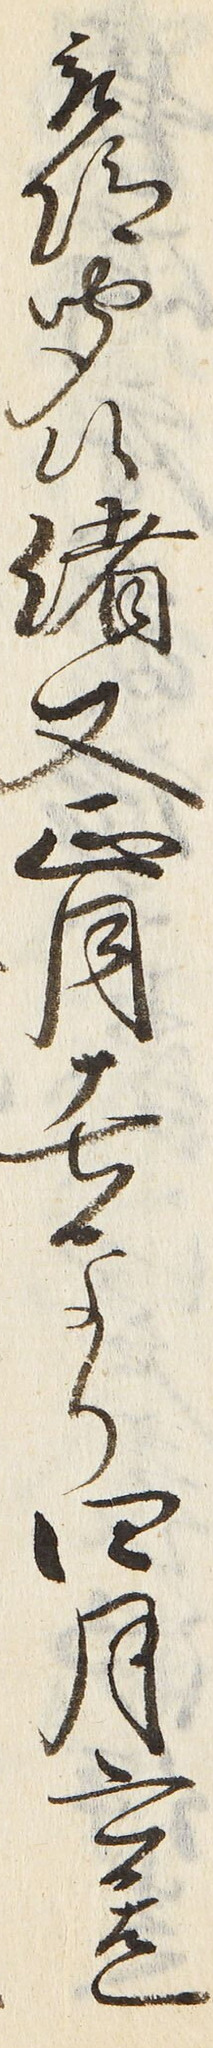被仰聞候諸又正月十七日より四月六日迄ニ
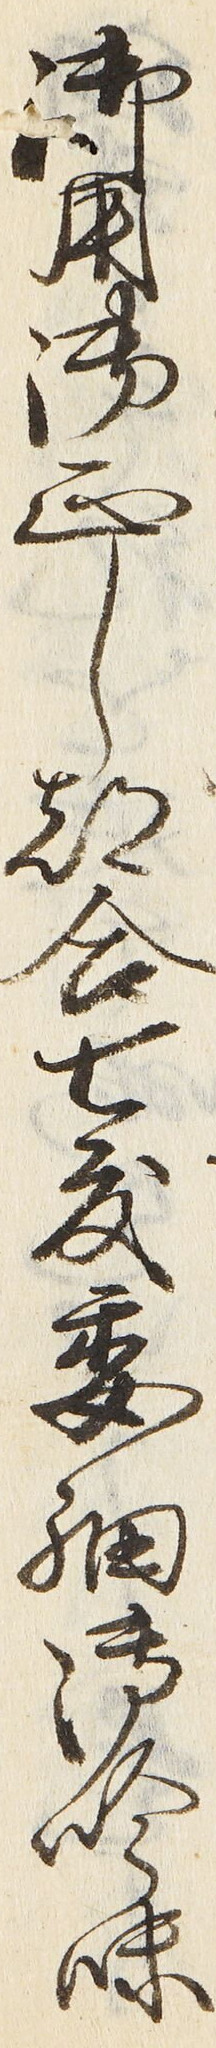御用御正し都合七度委細御吟味
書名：天保漂流記
